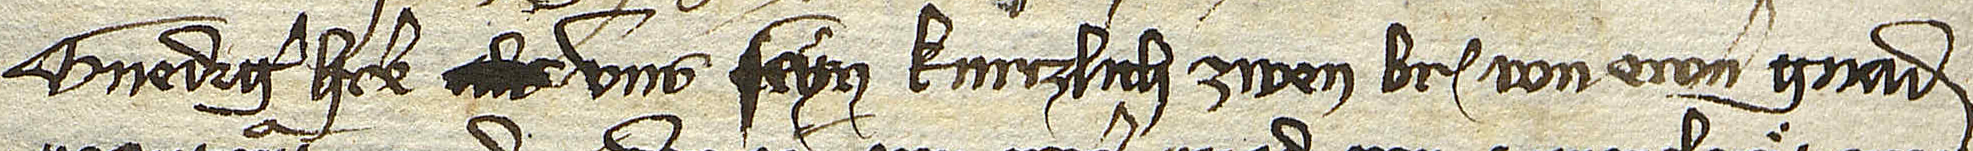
Gnedig* h*re als Vns ſeyn kurcʒlich ʒwen br* von ew*n gnad*
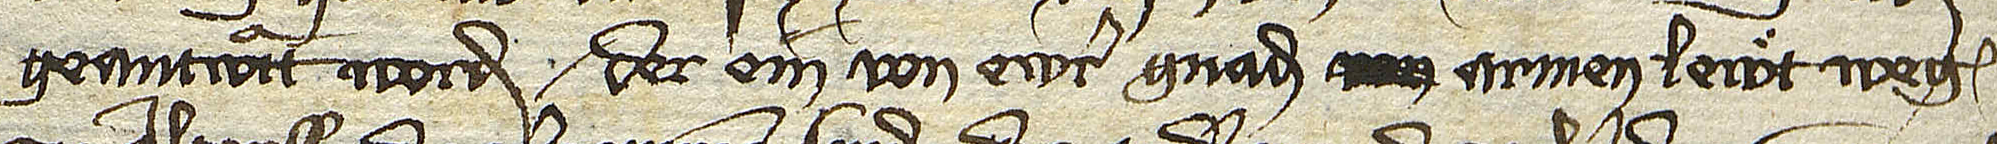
geantw*t word* . / der ein von ewr* gnad von armen leẅt weg*
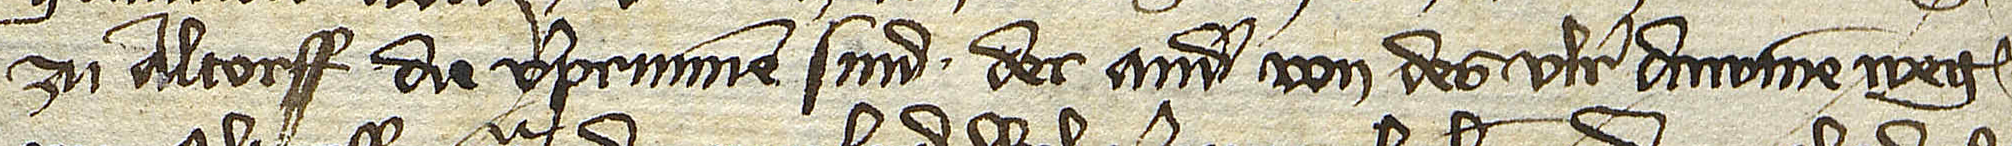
ʒu Altorff . die v*prunne* ſind . der and* von des vlr* dawme* weg*
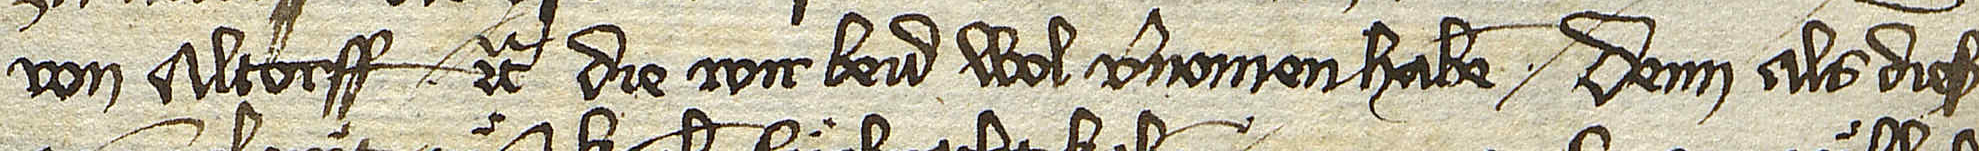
von Altorff ec* die wir beid wol v*nomen habe* / Denn als dieſ*
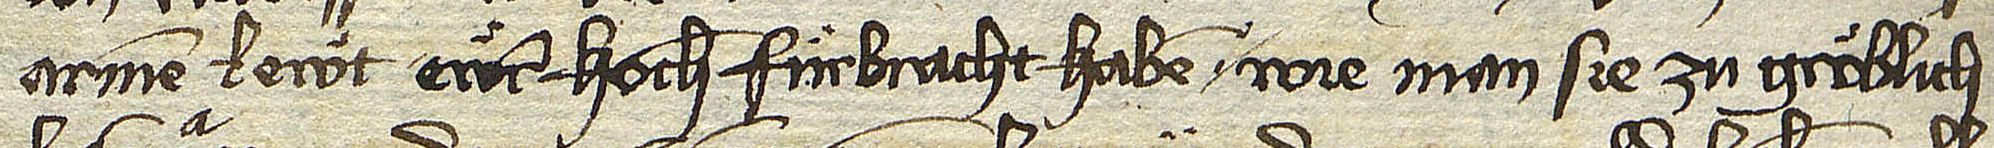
arme* leẅt eẅr hoch* fürbracht habe* / wie man ſie ʒu gröblich
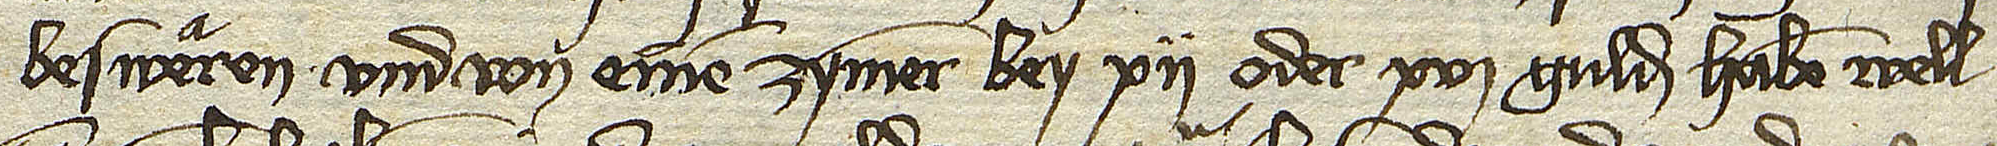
beſwëren . vnd von eine* ʒymer* bey xii oder xxi guld* habe* well
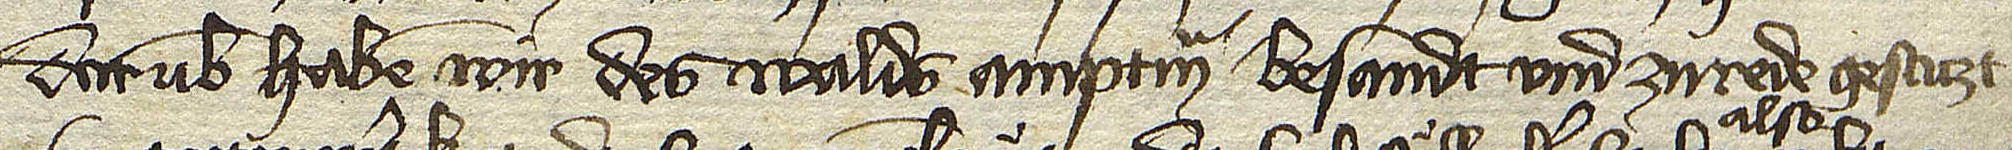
Dar*ub habe* wir des walds amptm* / beſandt vnd ʒurede geſacʒt
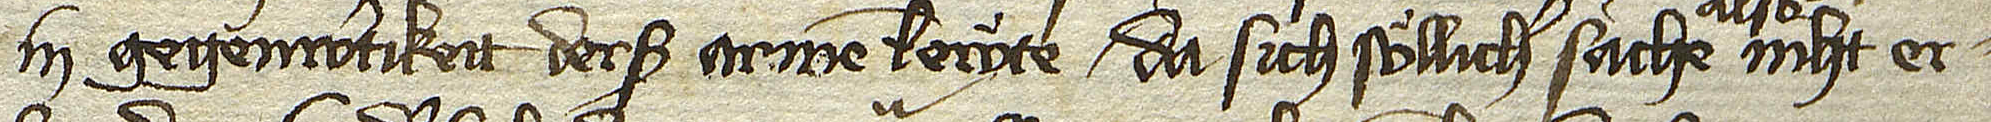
in gegenw*tikeit derſ* arme* leẅte / da ſich ſöllich ſache niht er =
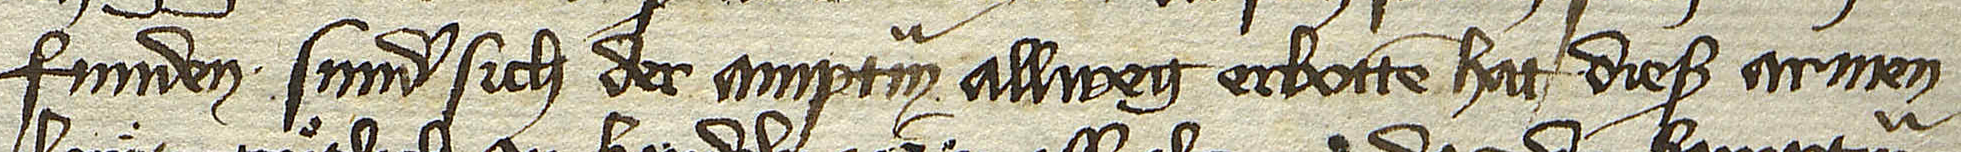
funden . ſund* ſich der amptm* allweg erbotte* hat dieſ* armen
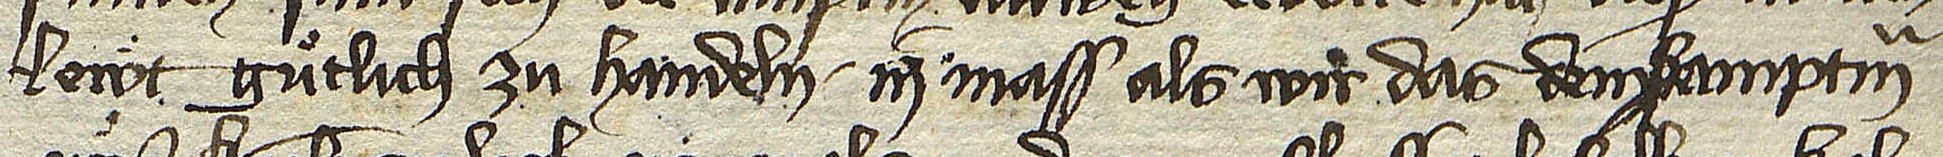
leẅt gütlich ʒu handeln / in maſſ als wir das demſ* amptm*
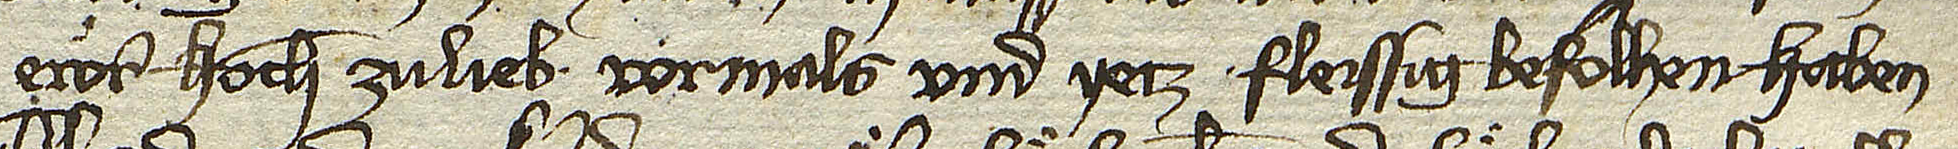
eẅr* hoch* ʒulieb . vormals vnd yecʒ . fleiſſig befolhen haben
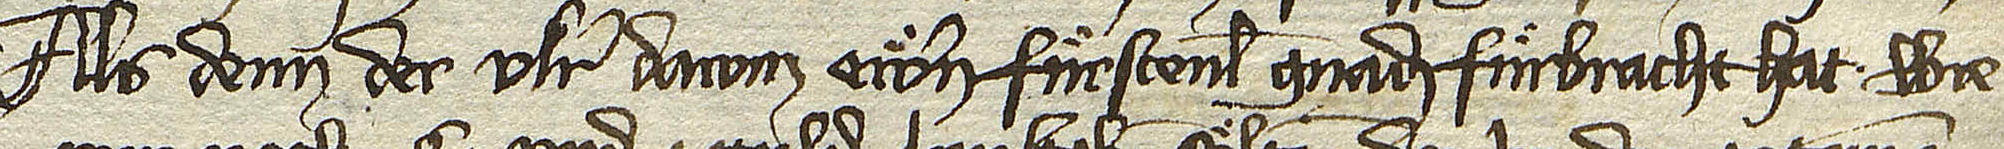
Als denn der vlr* dawm eẅn* fürſtenl* gnad* fürbracht hat . Wie
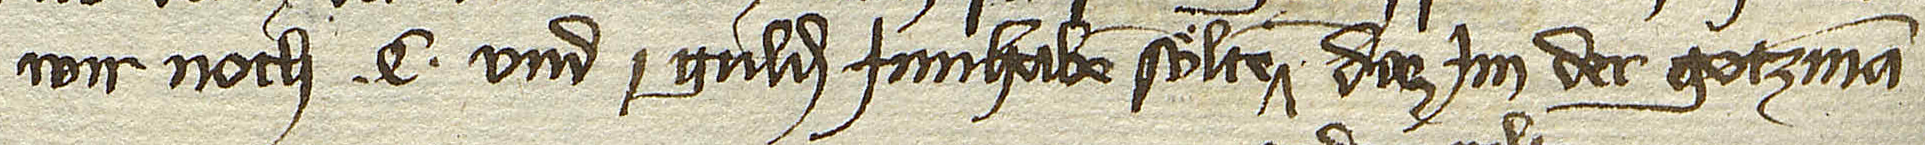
wir noch C. vnd / i guld* Innhabe* ſölte* daʒ Im der gocʒma*
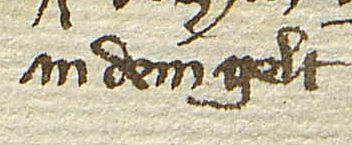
an dem gelt
